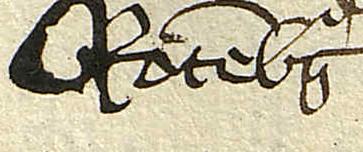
Rote*b*g
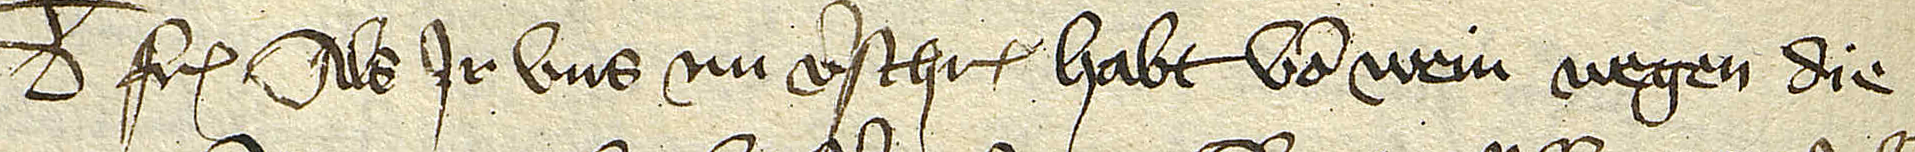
L* fr* / Als Ir vns nu v*ſchr* habt vo* wein wegen die
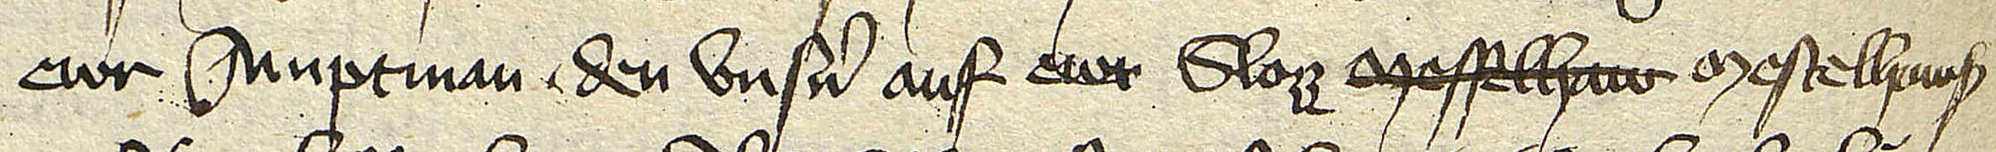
ewr Amptman / den vnſn* auf ewr Sloʒʒ Meſſelhaw Meſtelhawſ*
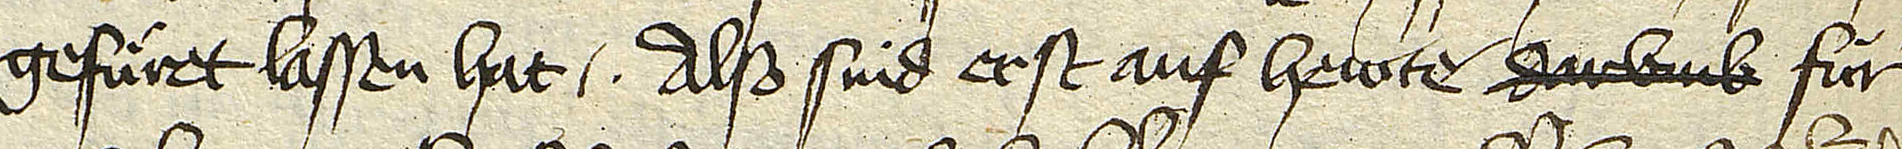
gefüret laſſen hat / . Alſo ſind erſt auf hewte / darvmb für
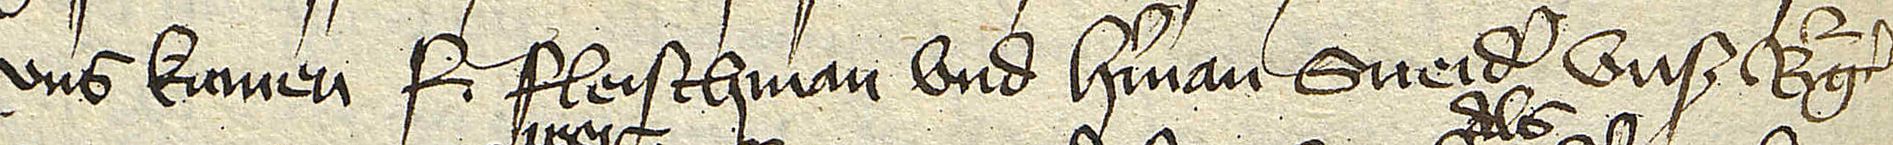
vns kumen F . Fleiſchman vnd h*man Sneid* vnſ* B*g*
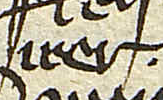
wer .
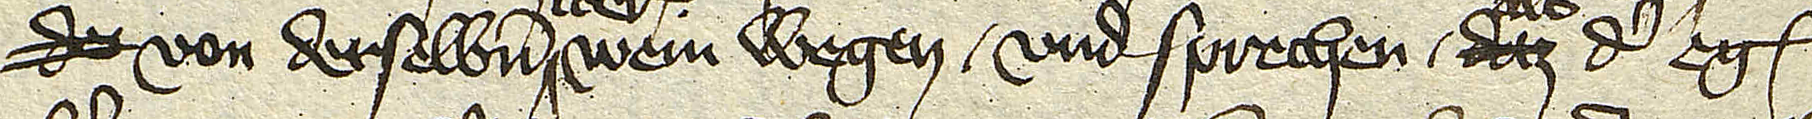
do von derſelbn* wein wegen / vnd ſprechen / daʒ d* eg*
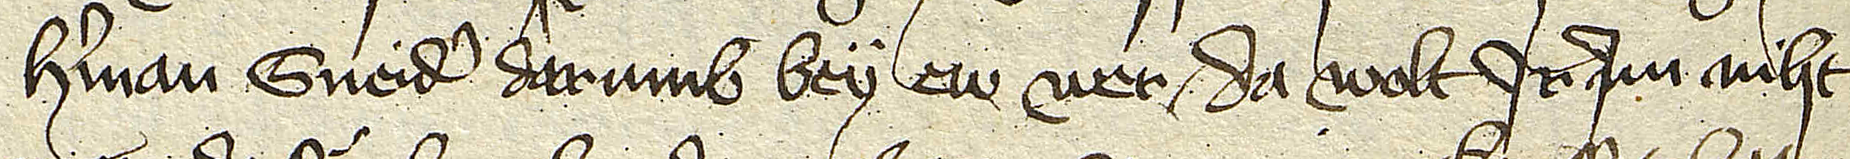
h*man Sneid* darumb bey ew wer / da wolt Ir Im niht
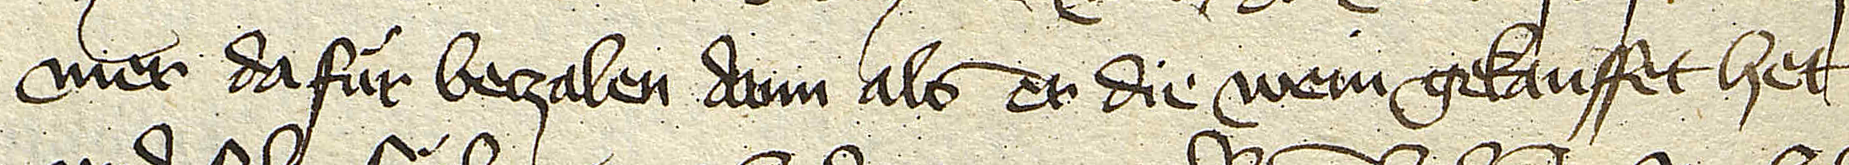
mer dafür becʒalen dann als er die wein gekauffet het
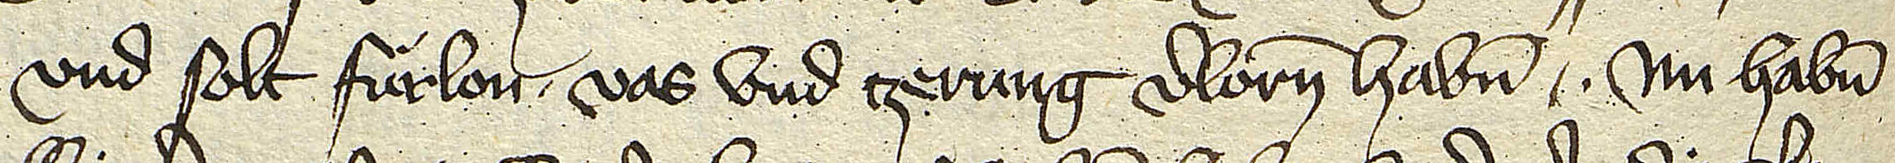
vnd ſolt fürlon / vas vns cʒerung v*lorn* habn* / . Nu habn*
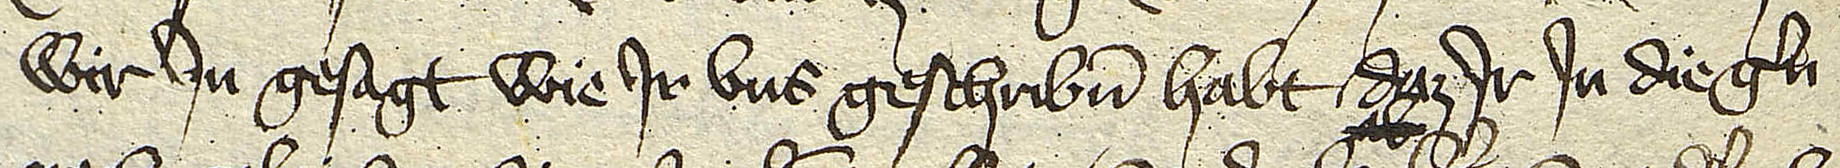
wir In geſagt wie Ir vns geſchribn* habt / daʒ Ir In die g*n
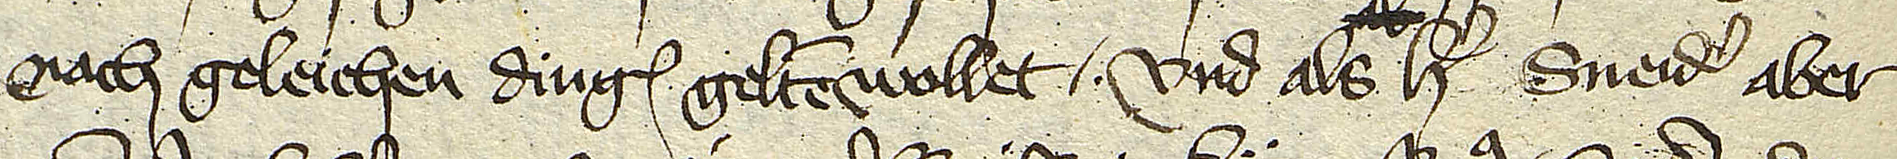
nach geleichen ding* gelte* wollet / . vnd als H* Sneid* aber
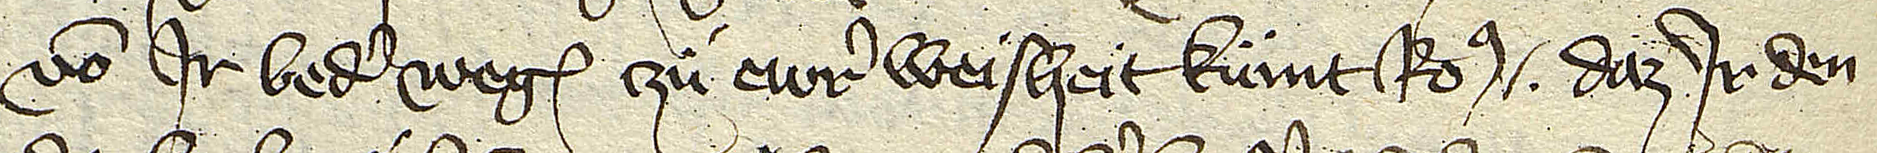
vo* Ir bed* weg* cʒü ewr* weiſheit kümt Ro* / . daʒ Ir den
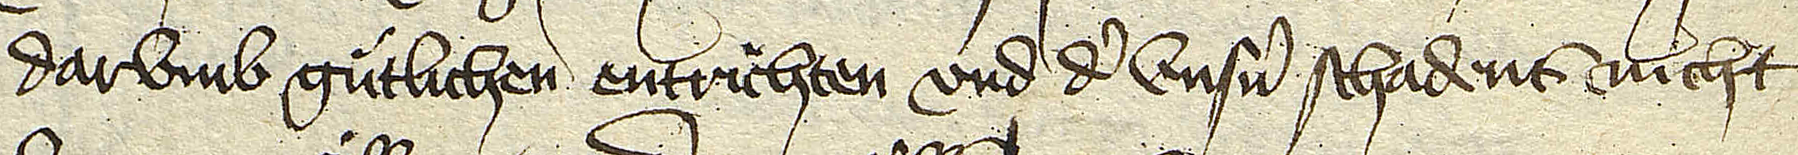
darvmb gütlichen entrichten vnd d* vnſn* ſchadens nicht
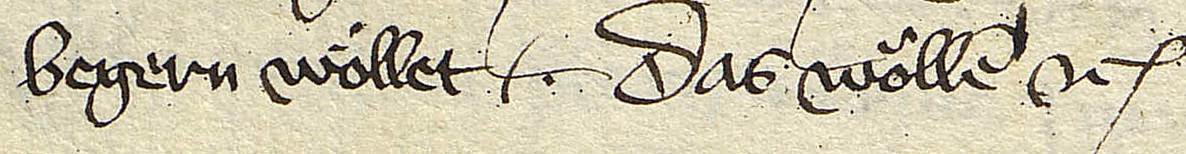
begern wöllet / . Das wölle* ec*
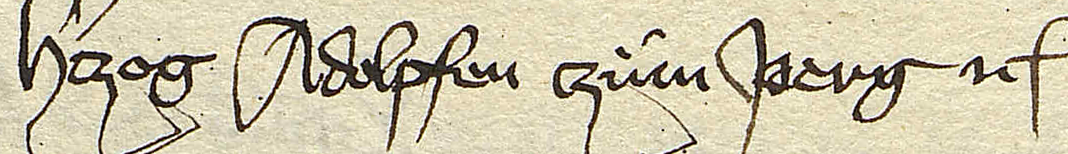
H*cʒog Adolphen cʒüm Perg ec*
